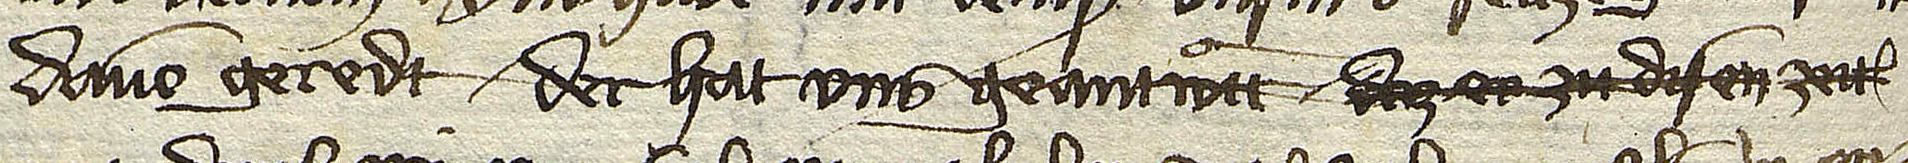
dauo* geredt / Der hat vns geantw*tt / daʒ er ʒu diſen ʒeit*
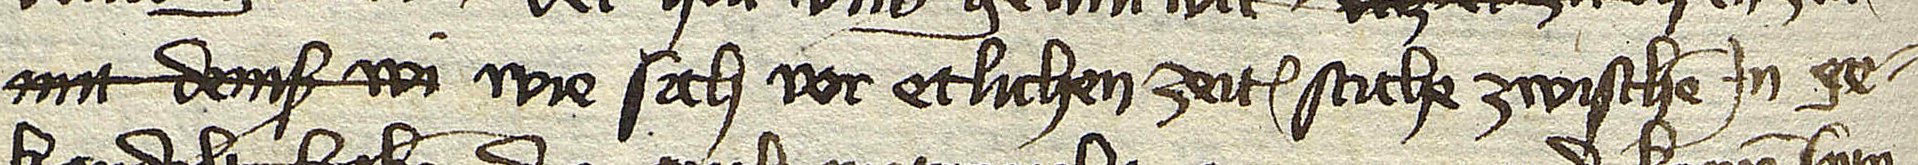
mit demſ* wi wie ſich vor etlichen ʒeit* ſache ʒwiſche* In ge =
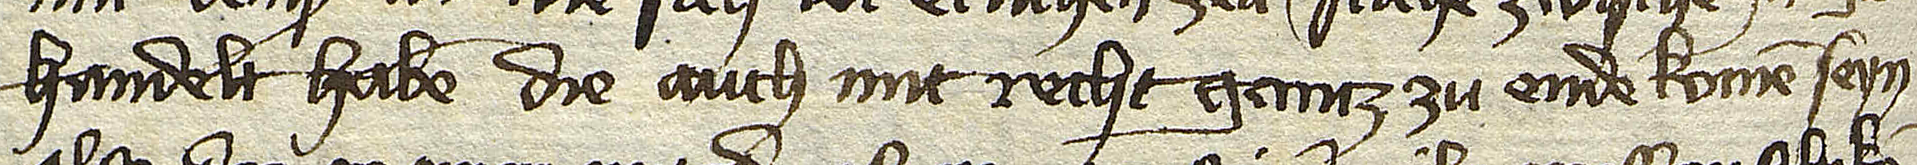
handelt habe* die auch mit recht gancʒ ʒu ende kome* ſeyn
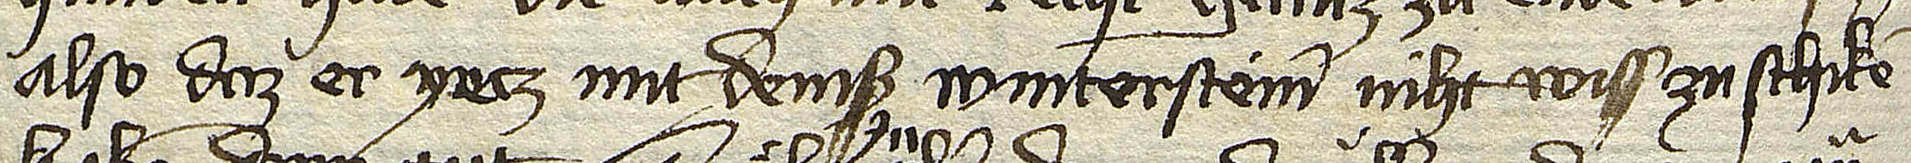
alſo daʒ er yecʒ mit demſ* winterſtein* niht wiſſ ʒu ſchike*
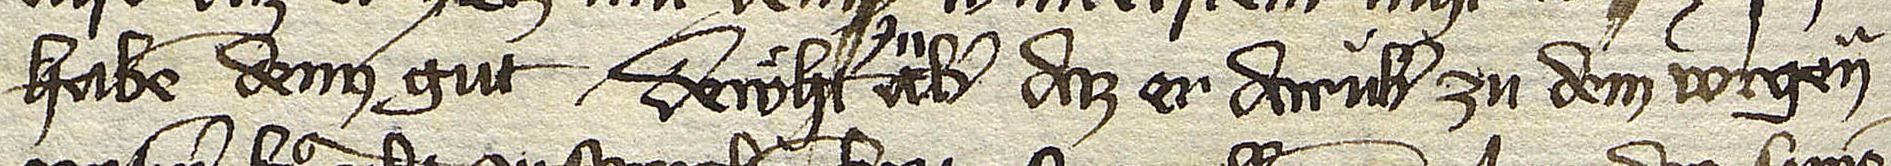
habe* denn gut / Deẅht ab* daʒ er darüb* ʒu dem vorgen*
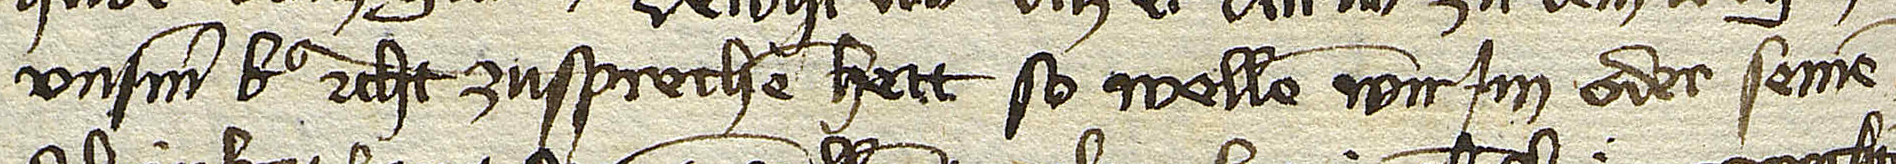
vnſ*m b* icht ʒuſpreche* hett ſo welle* wir Im oder ſeine*
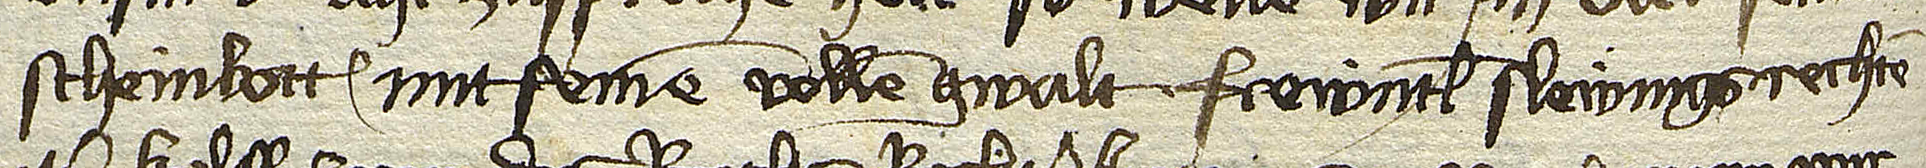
ſcheinbott* mit ſeine* volle* gwalt freẅntl* ſleẅnigs rechte*
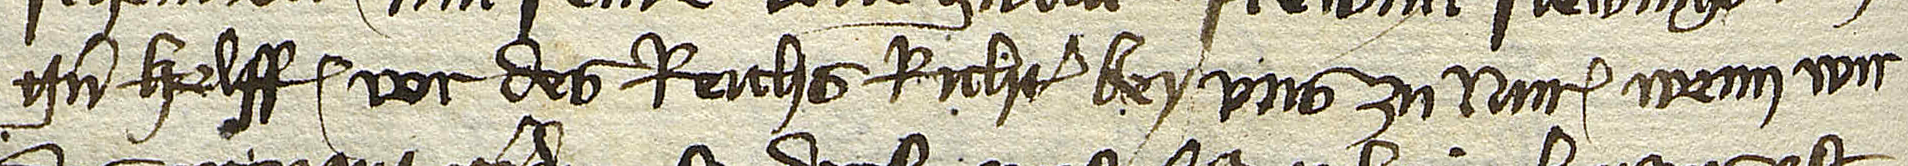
g*n helff* vor des Reichs Richt* bey vns ʒu Nur* wenn wir
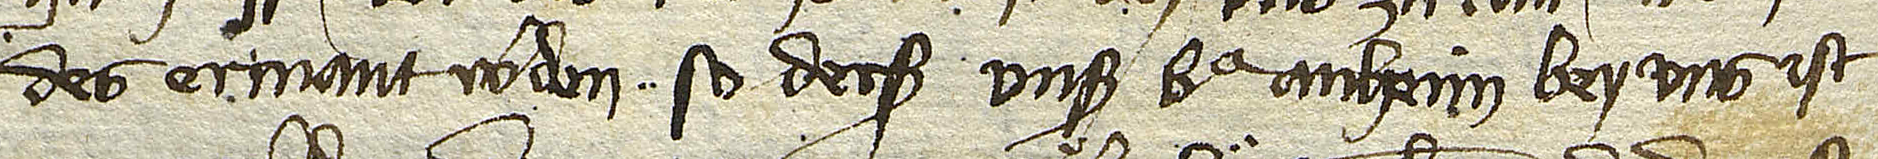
des ermant w*den . ſo derſ* vnſ* b* anheim bey vns iſt
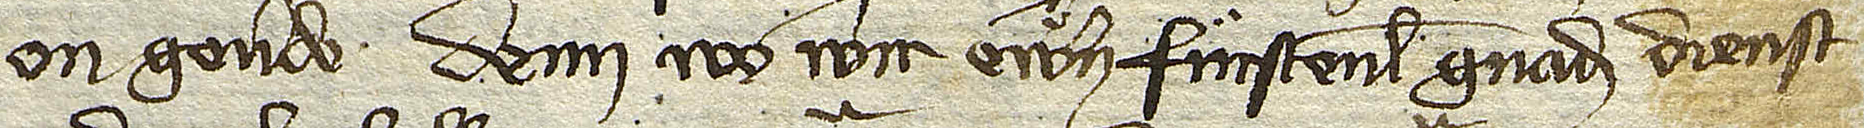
on geu*de Denn wo wir eẅn* fürſtenl* gnad* dienſt
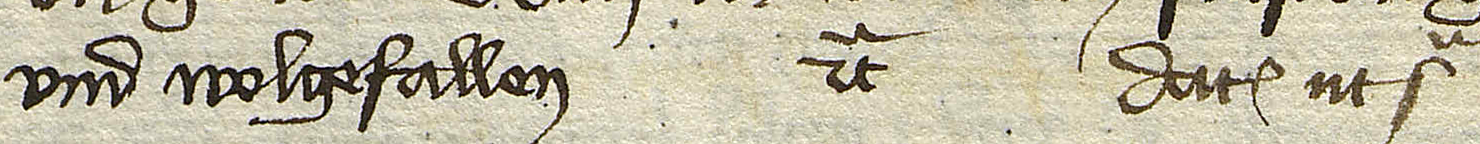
vnd wolgefallen ec* Dat* ut ſ*
